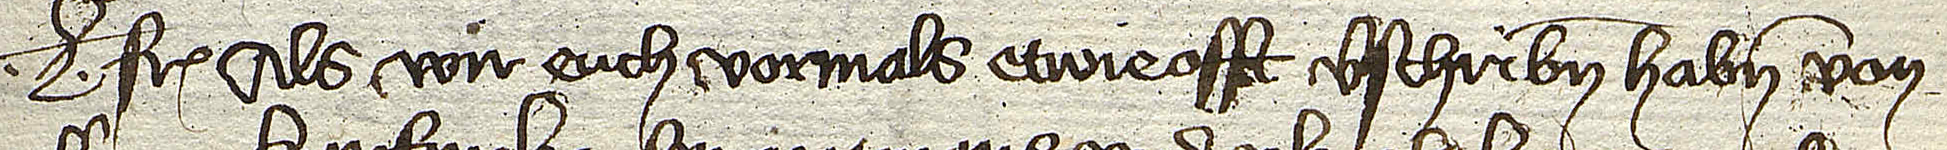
L* fr* Als wir euch vormals etwieofft v*ſchribn* habn* von
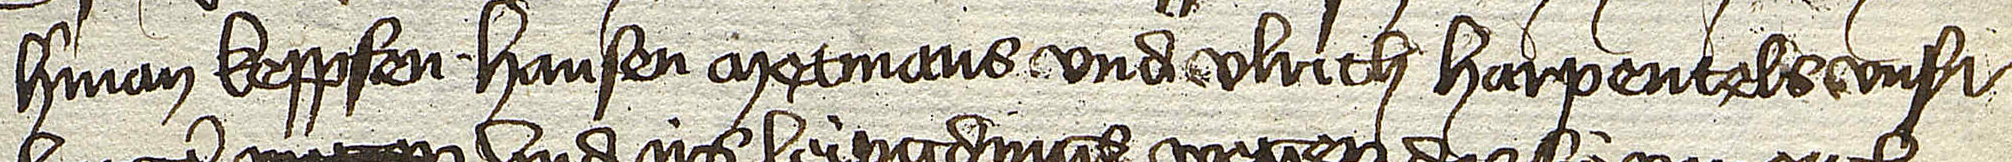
h*man keppfen . hanſen Metmans vnd vlrich harpentels vnſ*r
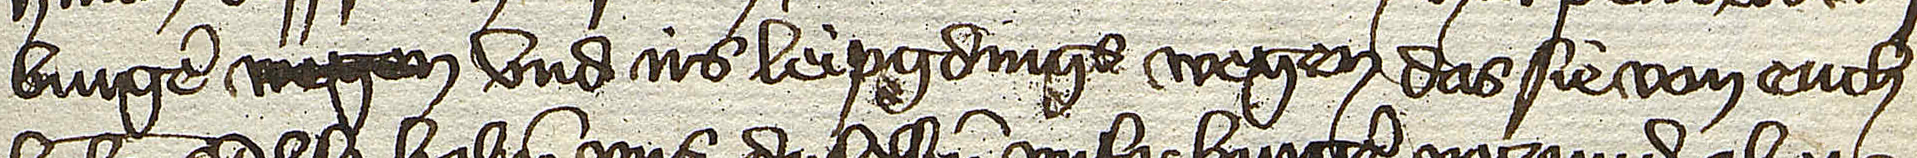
burge* wegen vnd irs leipgdings wegen das ſie von euch
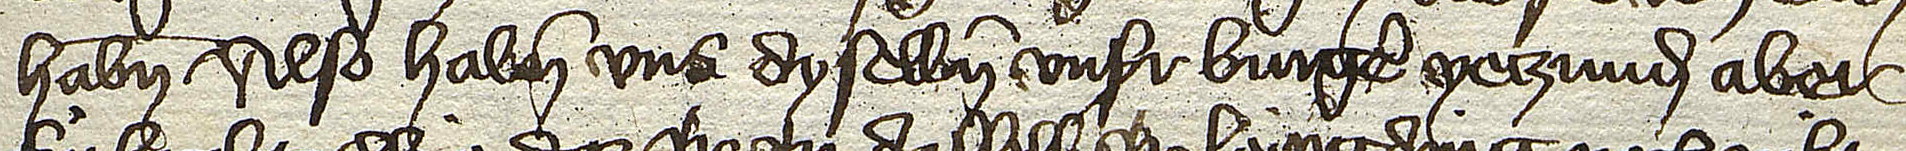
habn* / Alſo habn* vns dyſelbn* vnſ*r burge* yecʒund* aber
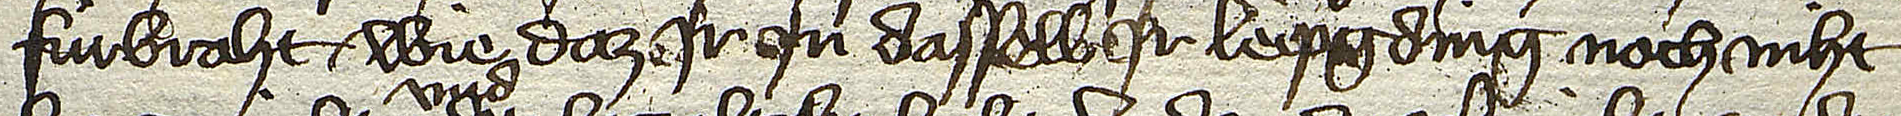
fürbraht / wie daʒ Ir In daſſelb Ir leipgding noch niht
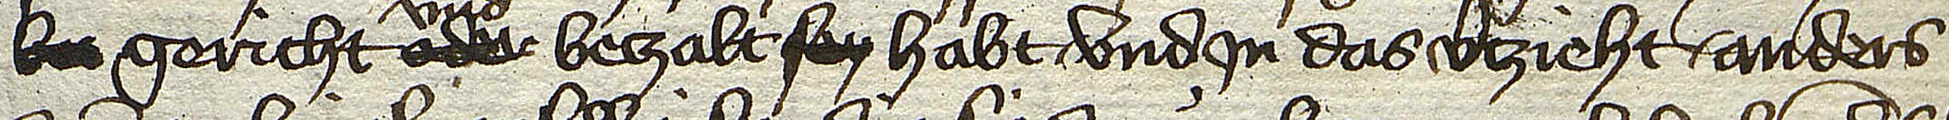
be gericht oder becʒalt ſey habt / vnd In das v*cʒieht / anders
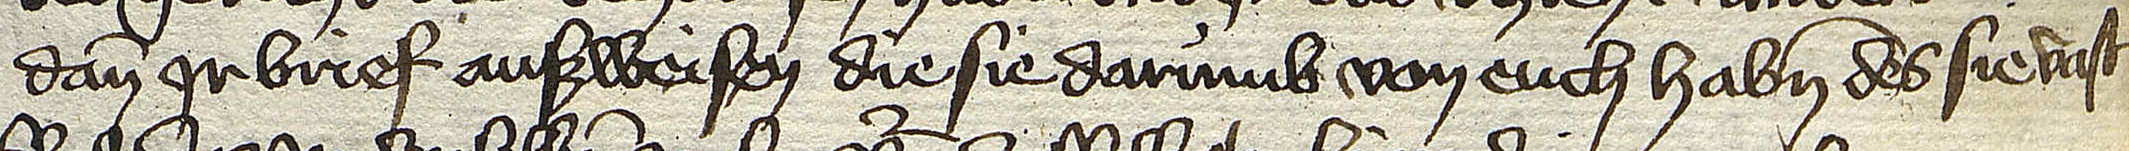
dan* Ir brief auſʒweiſen die ſie darümb von euch habn* des ſie vaſt
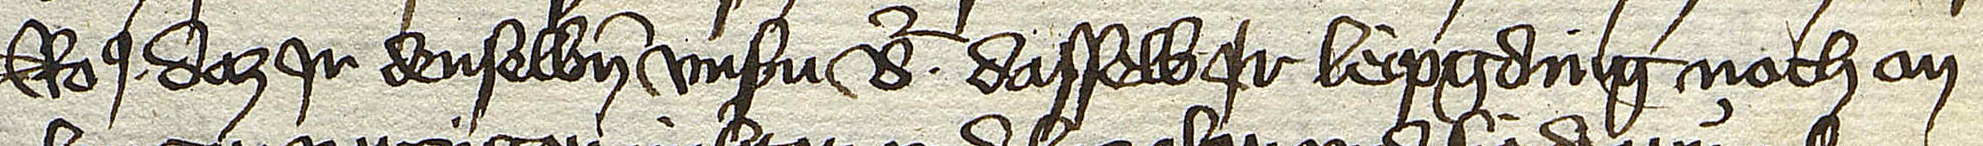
Ro* / daʒ Ir denſelbn* vnſ*n B* . daſſelb Ir leipgding noch on
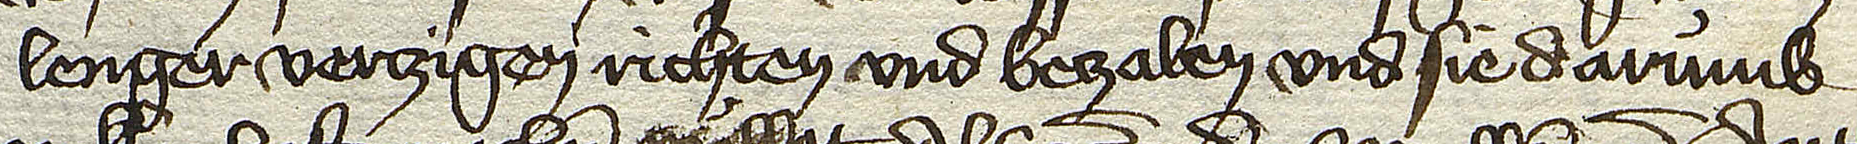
lenger vercʒigen richten vnd becʒalen vnd ſie darümb
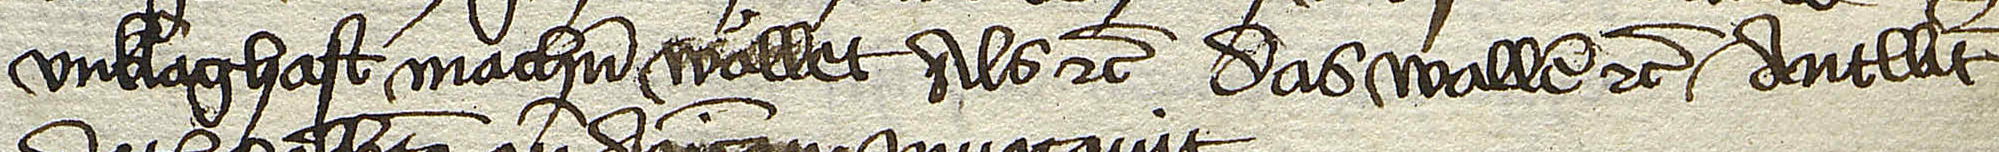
vnklaghaft machn* wöllet Als ec* Das wolle* ec* / Antw*t
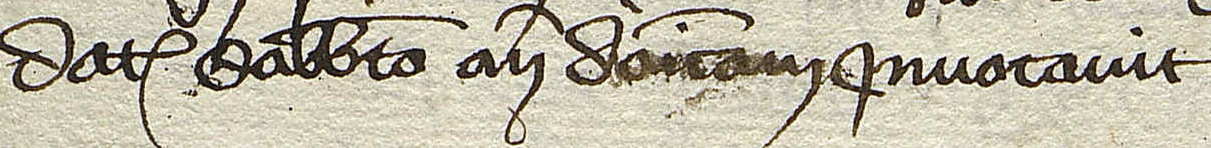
Dat* Sabbto* an* Do*icam Inuocauit
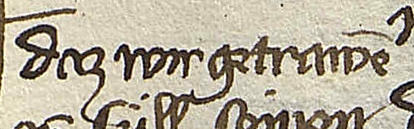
daʒ wir getrawe*
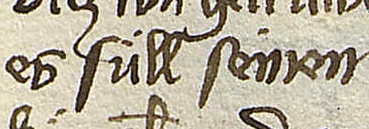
es ſüll ſeinen
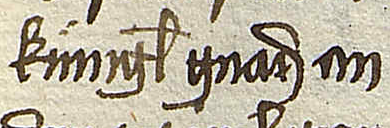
künigl* gnad* an
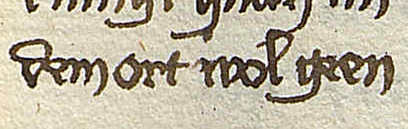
dem ort wol geen
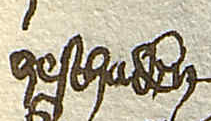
cʒeſchade*n
